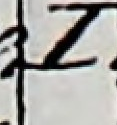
I
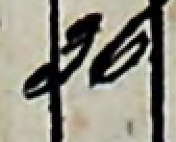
36
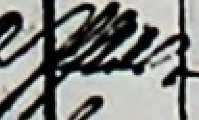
Pflinds„
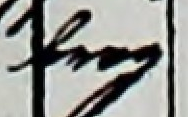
berg
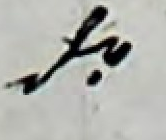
Do
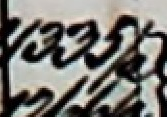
1335/a
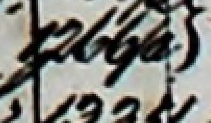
1269/a
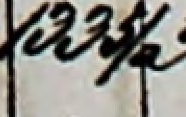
335/a
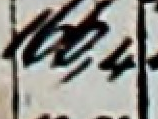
166,4
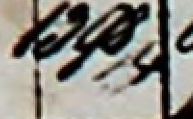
1398,4
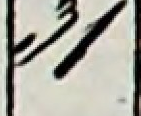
31
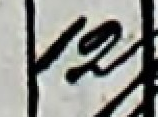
12
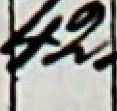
42
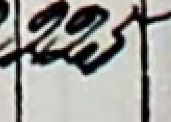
225
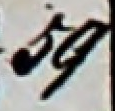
59
